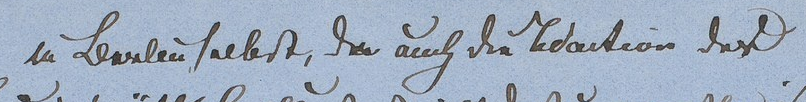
in Berlin selbst, da auch die Redaction des
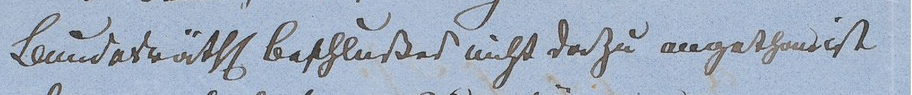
Bundesräthl Beschlußes nicht dazu angethan ist
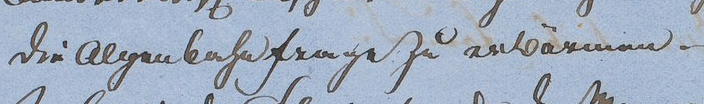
die Alpenbahnfrage zu erwärmen. –
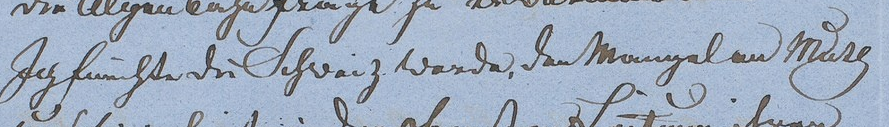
Ich fürchte die Schweiz werde, den Mangel an Muth
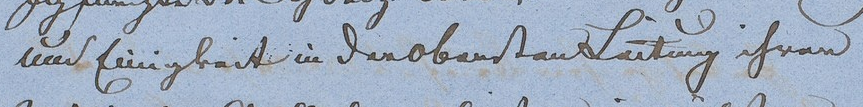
und Einigkeit in der obersten Leitung ihrer
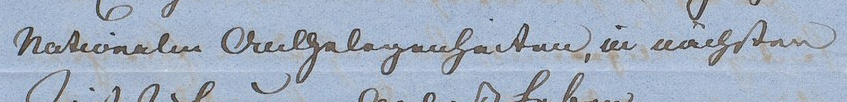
nationalen Angelegenheiten, in nächster
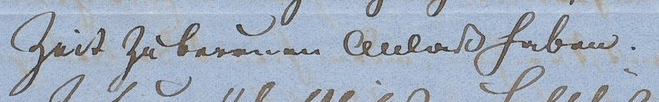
Zeit zu bereuen Anlaß haben.
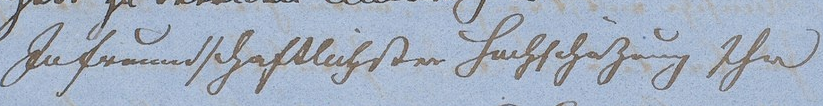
In freundschaftlichster Hochschätzung Ihr
